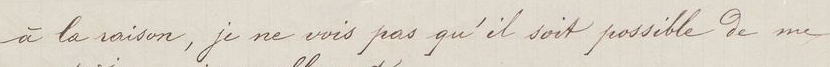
à la raison, je ne vois pas qu'il soit possible de me
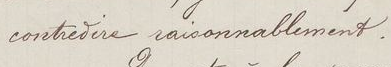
contredire raisonnablement.
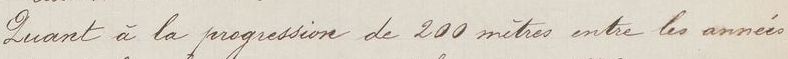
Quant à la progression de 200 mètres entre les années
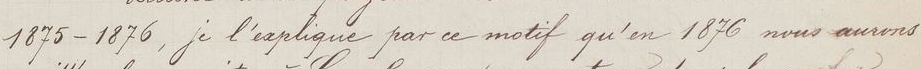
1875–1876, je l'explique par ce motif qu'en 1876 nous aurons
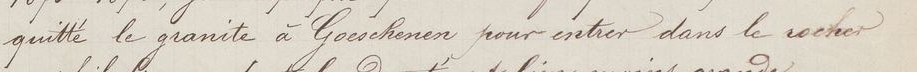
quitté le granite à Goeschenen pour entrer dans le rocher
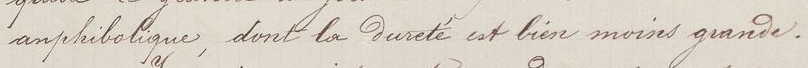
anphibolique, dont la dureté est bien moins grande.
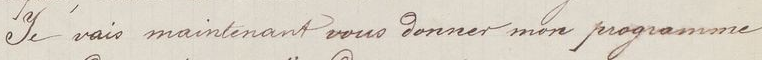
Je vais maintenant vous donner mon programme
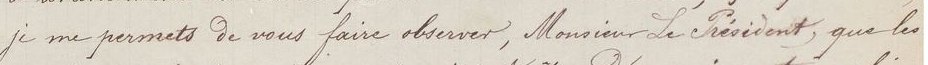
je me permets de vous faire observer, Monsieur Le Président; que les
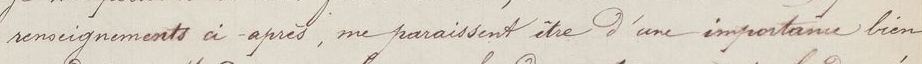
renseignements ci-après, me paraissent être d'une importance bien
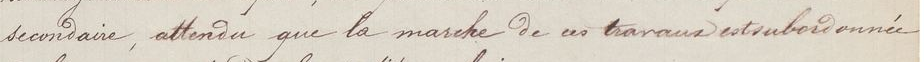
secondaire, attendu que la marche de ces travaux est subordonnée
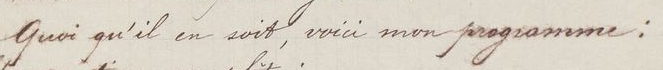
Quoi qu'il en soit, voici mon programme:
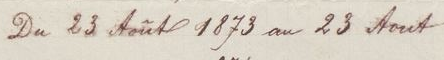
Du 23 Août 1873 au 23 Aout
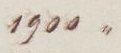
1600 m.
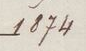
1874
